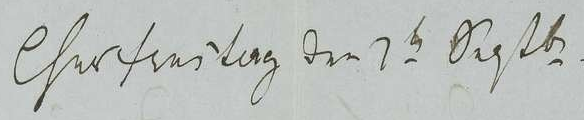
Chur Freitag den 2tn Septb
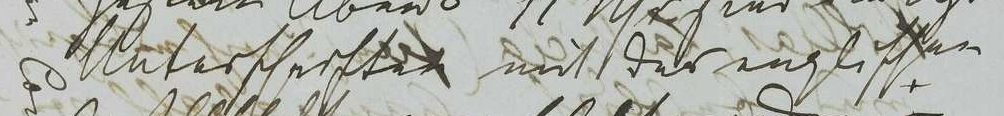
Unterschriften mit der englischen
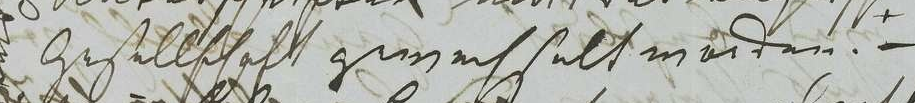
Gesellschaft gewechselt worden. –
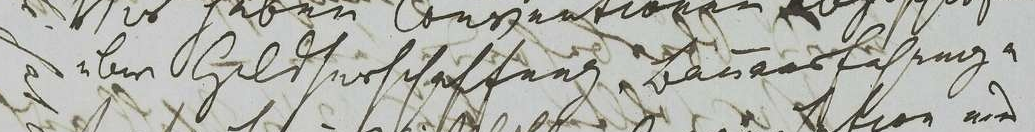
über Geldherschaffung, Bauausführung a
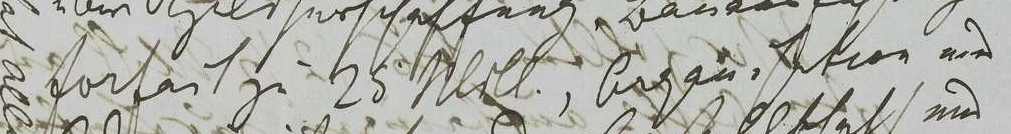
forfait zu 25 Mill., Organisation und
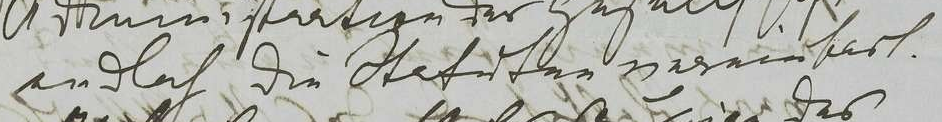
endlich die Statuten vereinbart.
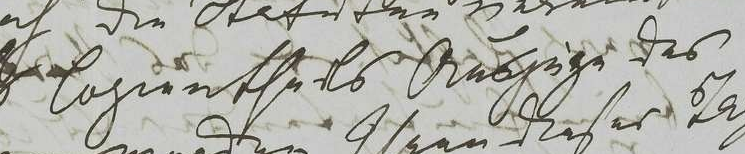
Copien theils Auszüge des
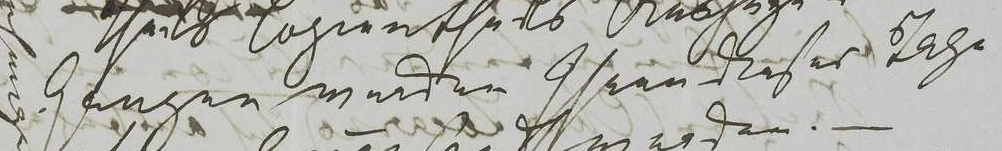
Ganzen werden Ihnen dieser Tage
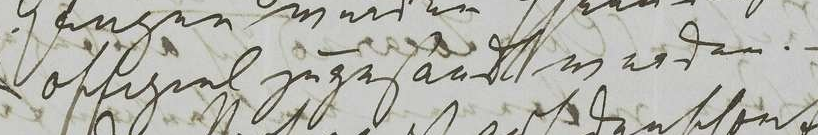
offiziel zugesandt werden. –
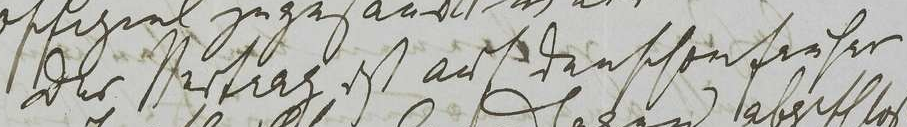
Der Vertrag ist auf den schon früher
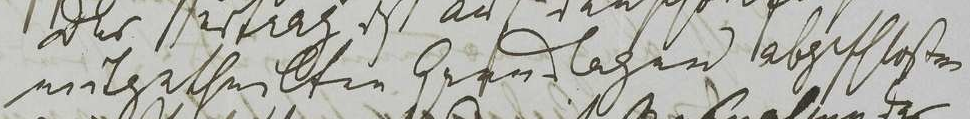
mitgetheilten Grundlagen abgeschloßen.
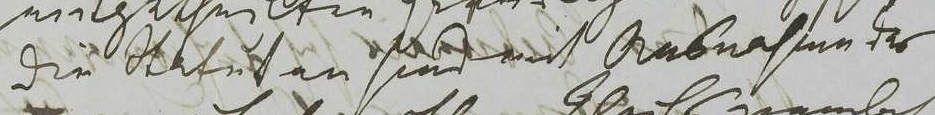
Die Statuten sind mit Ausnahme des
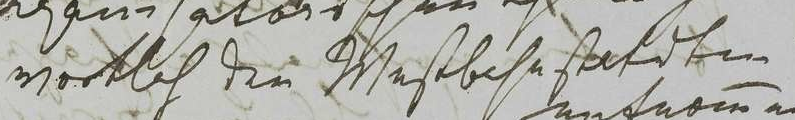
wörtlich den Westbahnstatuten
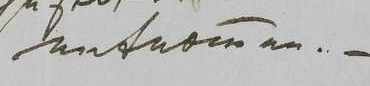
entnommen. –
